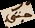حتى
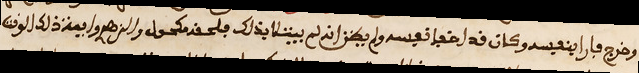وخرج فارا بنفسه وكان قد اخفا نفسه ولم يظن انه لم يبتلا بذلك فلحقه مكحول والزهرى وايمة ذلك الوقت
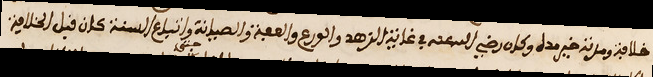خلافة ومدته خير مده وكان رضي الله عنه في غاية الزهد والورع والعفة والصيانة واتباع السنة كان قبل الخلافة
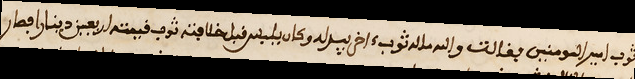ثوب امير المومنين بقالت والله ماله ثوب ءاخر يبدله وكان يلبس قبل خلافته ثوب قيمته اربعين ذينارا فصار
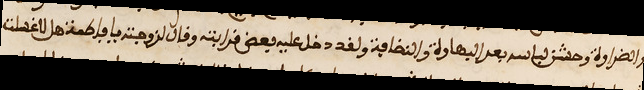والضراوة وحشن لباسه بعد البهاوة والنضافة ولقد دخل عليه بعض قرابته وقال لزوجته يا فاطمة هل لا غسلت
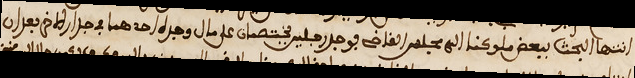انتها البحث ببعض ملوكنا الى مجلس القاضى بوجد رجلين يختصمان على مال وجده احدهما في جدار الاخر بعد ان
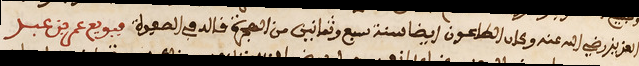العزيز رضي الله عنه وكان الطاعون ايضا سنة سبع وثمانين من الهجرة قاله في الصفوة فبويع عمر بن عبد
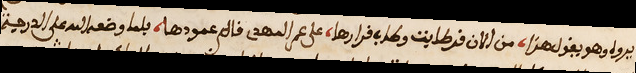يروه وهو يقول هذا من الان قد طابت وطاب قرارها على عمر المهدى قام عمودها بلما وضعه الله على الدرجة
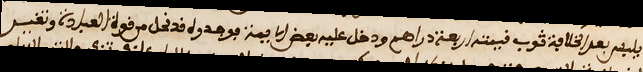يلبس بعد الخلافة ثوب قيمته اربعة دراهم ودخل عليه بعض الايمة فوجدوه قد نحل من قوة العبادة وتغير
